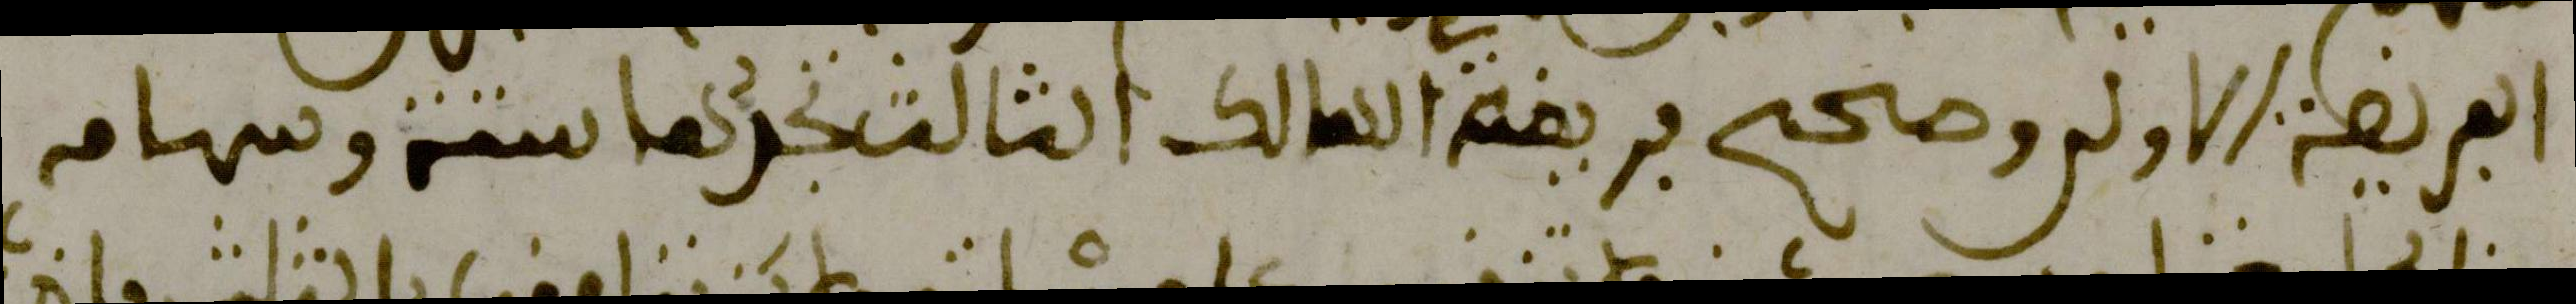الفريضة الاولى وصحح فريضة الهالك الثالث تجدها ستة وسهامه
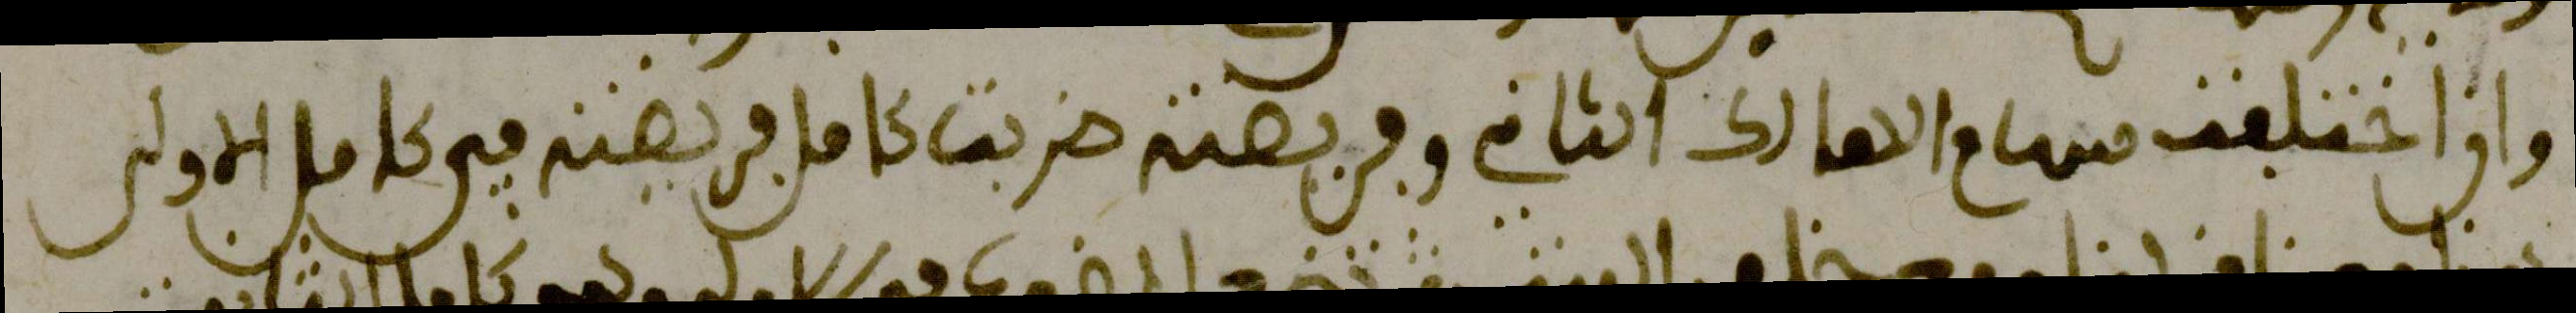وان اختلفت يهام الهالك الثاني وفريضته ضربت كامل في يضته في كامل الاولى
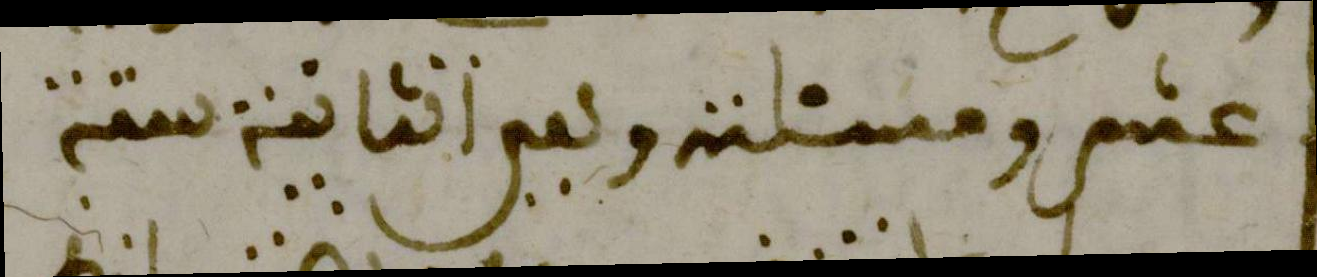عشر ومسئلته وهي الثانية ستة
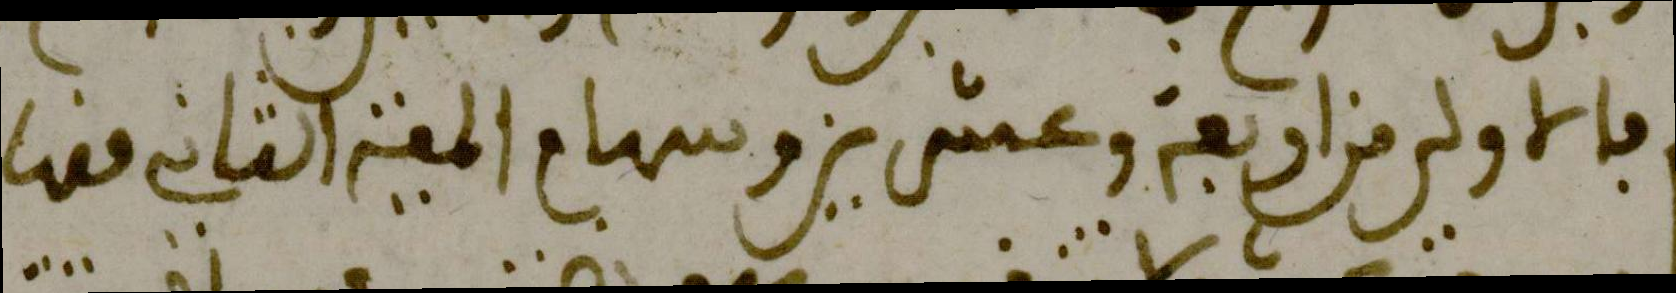فالاولى من اربعة وعشرين وسهام المية الثاني منها
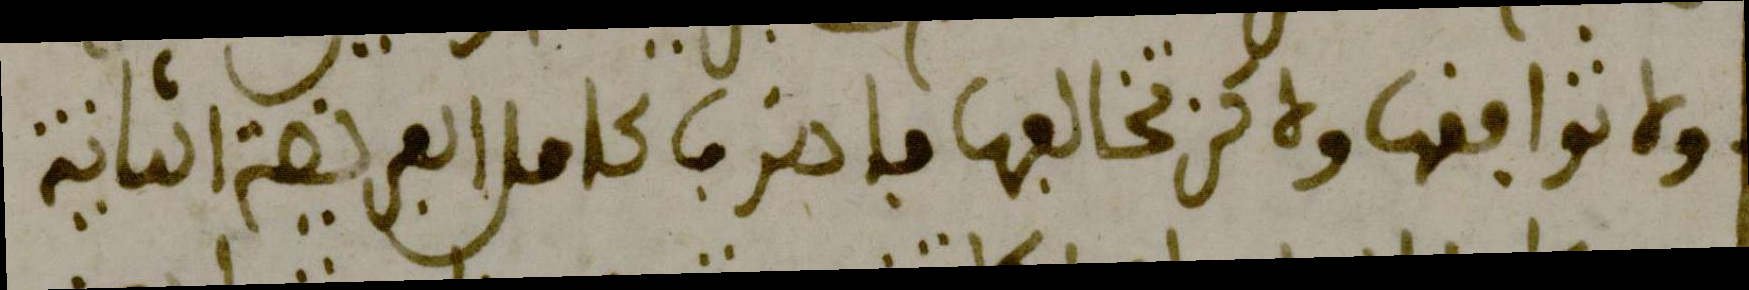ولا توافقها ولاكن مخالفها فاضرب كامل الفريضة الثانية
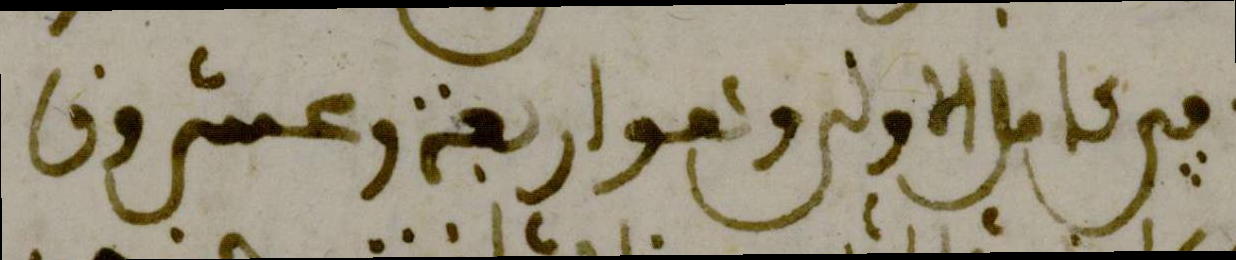في كامل الاولى وهو اربعة وعشرون
